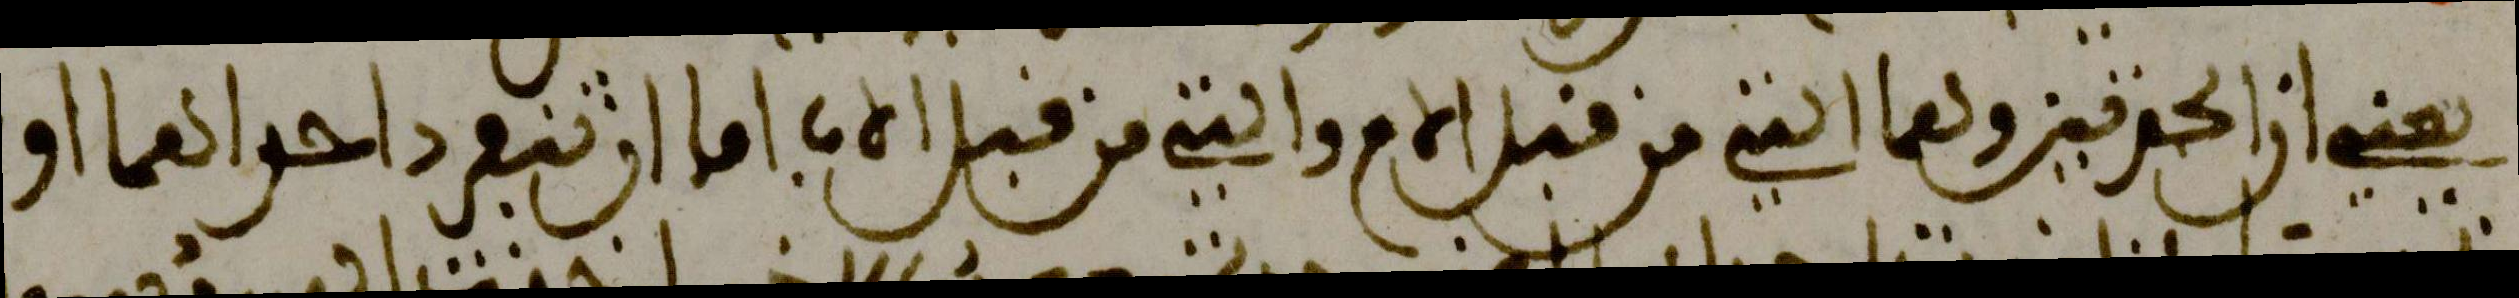يعني ان الجدتين وهما التي من قبل الام والتي من قبل الاب اما ان تنفرد احداهما او
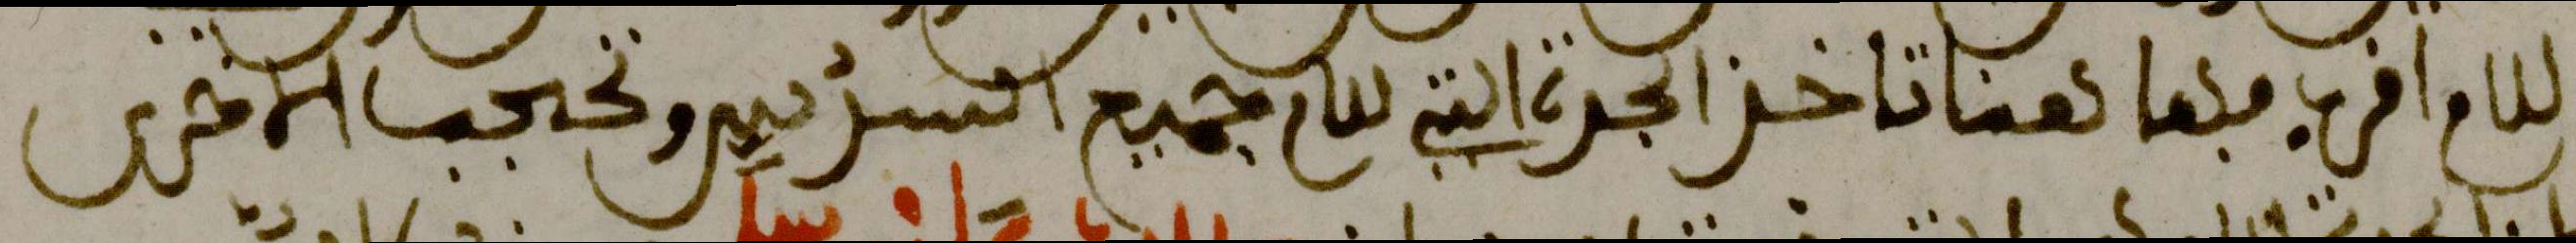للام اقرب فهاهنا تاخذ الجدة التي للام جميع السدس وتحبب الاخرى
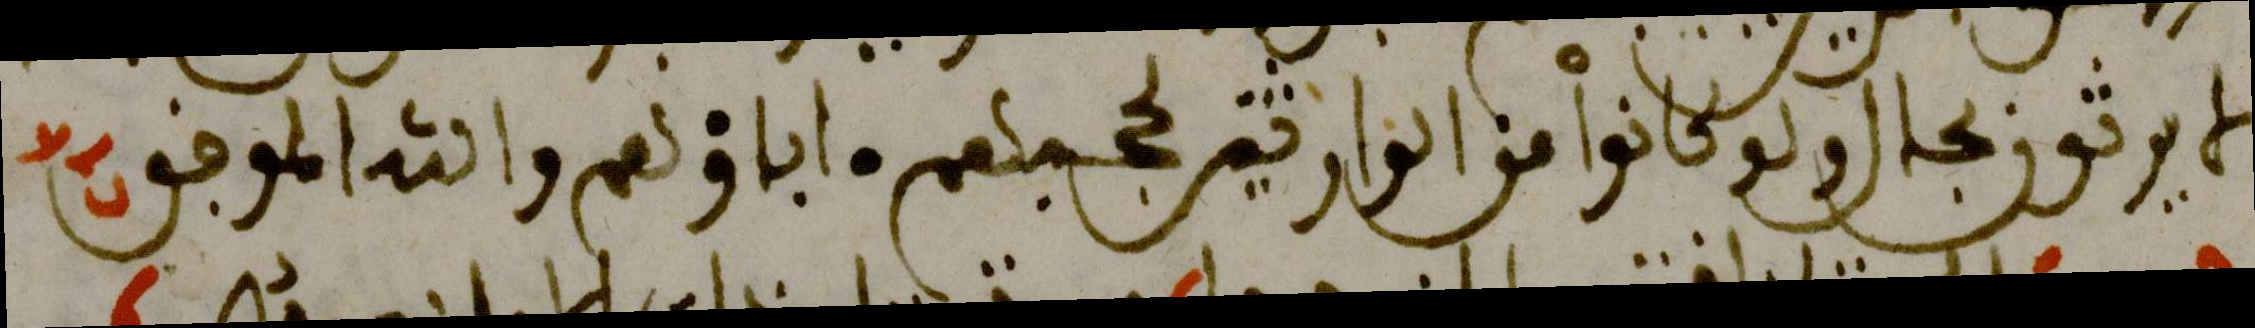لا يرثون بحال ولو كانوا من الورثين لحجبهم ءاباؤهم والله الموفق
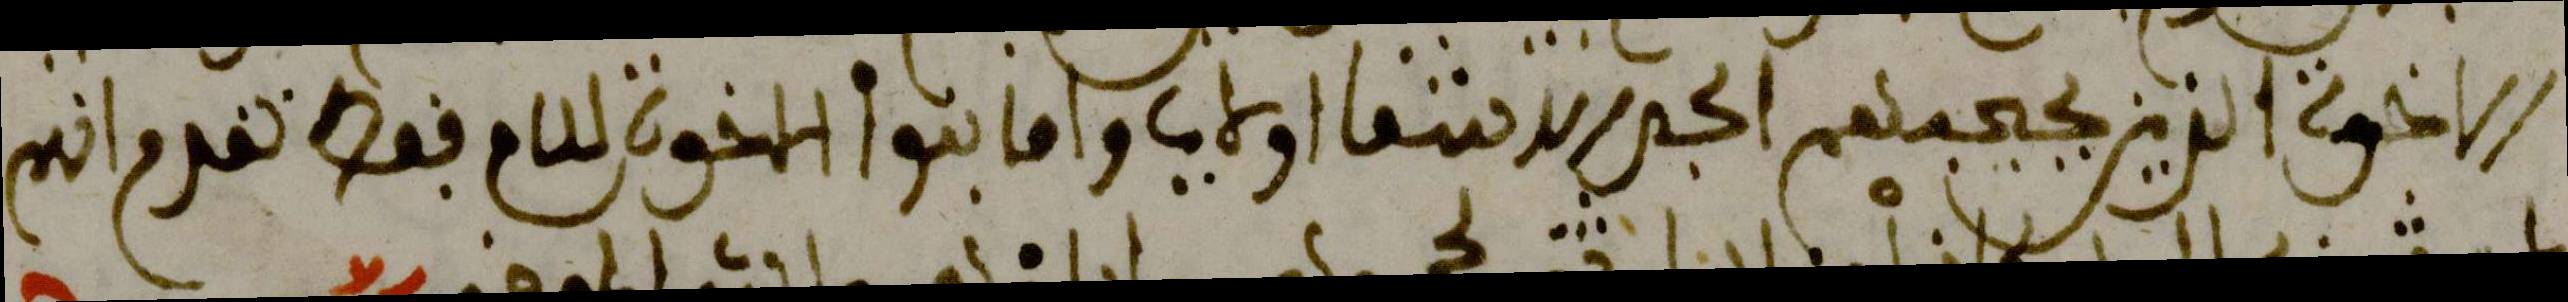الاخوة الذين يحجبهم الجد الاشقا او لاب واما بنوا الاخوة للام فقط تقدم انهم
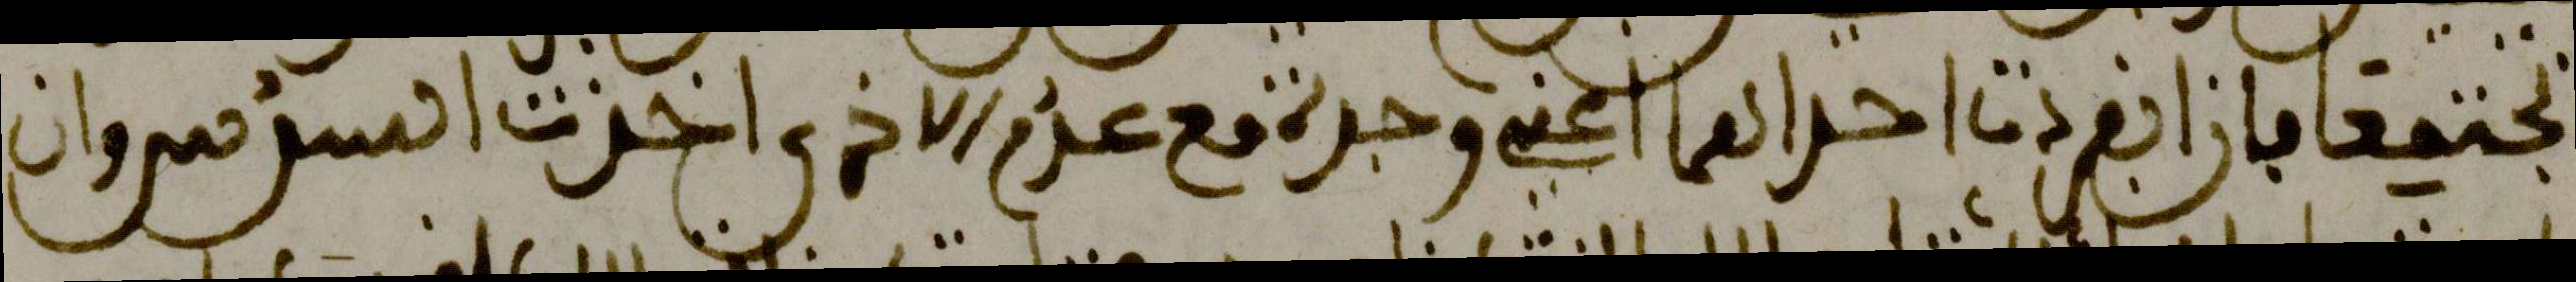يجتمعا فان انفردت احداهما اعني وجدة مع عدم الاخرى اخذت السدس وان
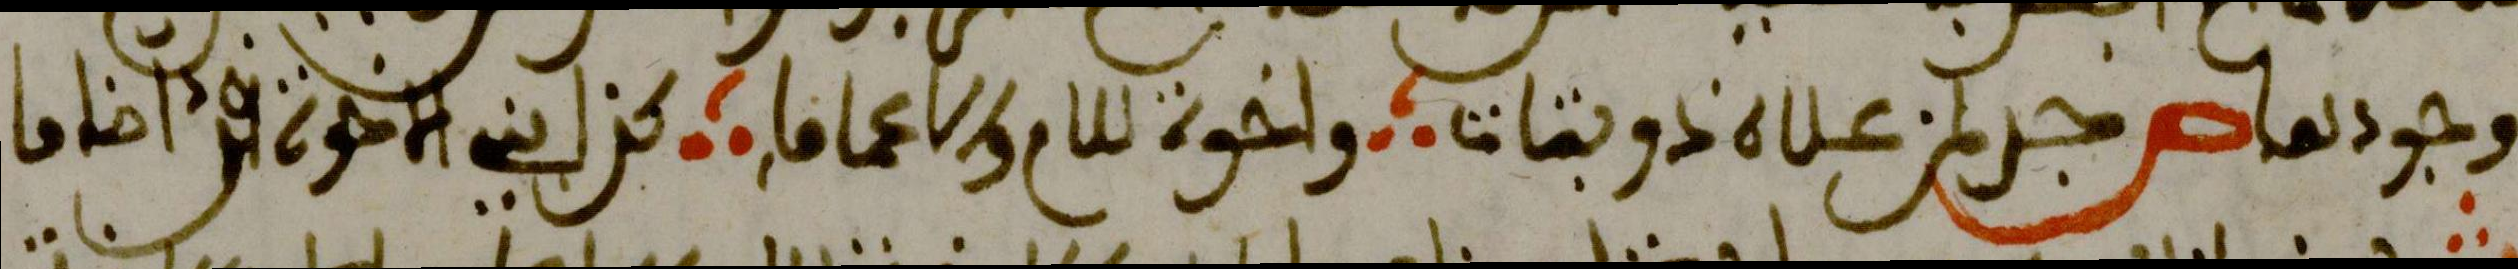وجودها ص جد لمن علاه ذو بتات واخوة للام والاعماما كذا بني الاخوة قد اضاما
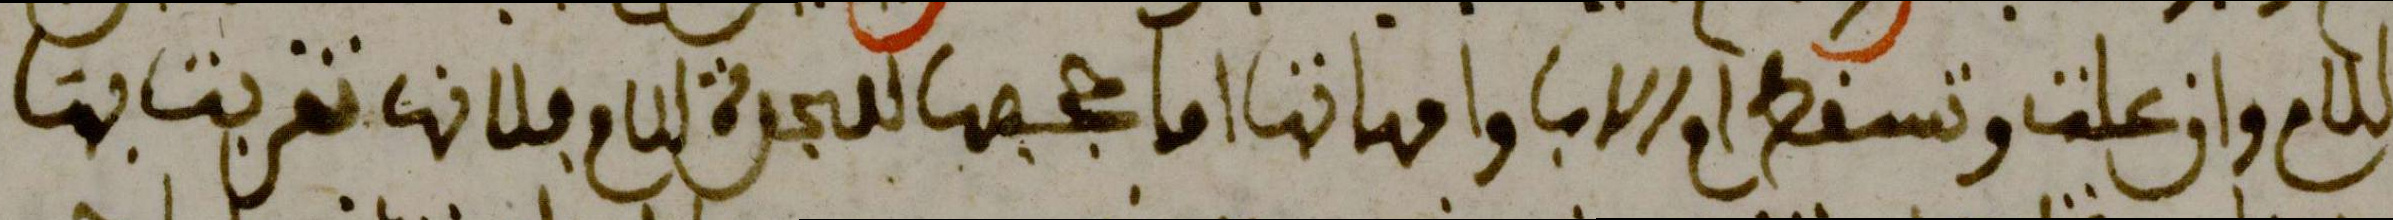للام وان علت وتسقط ام الاب وامهاتها اما حجبها للجدة للام فلانها تقربت بها
